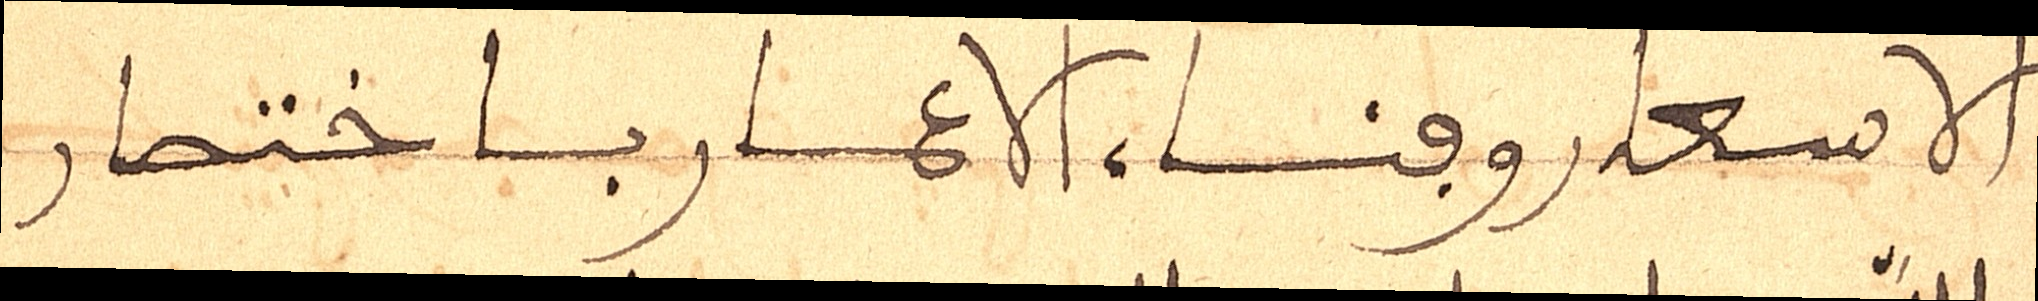الاسعار وفناء الاعمار باختصار
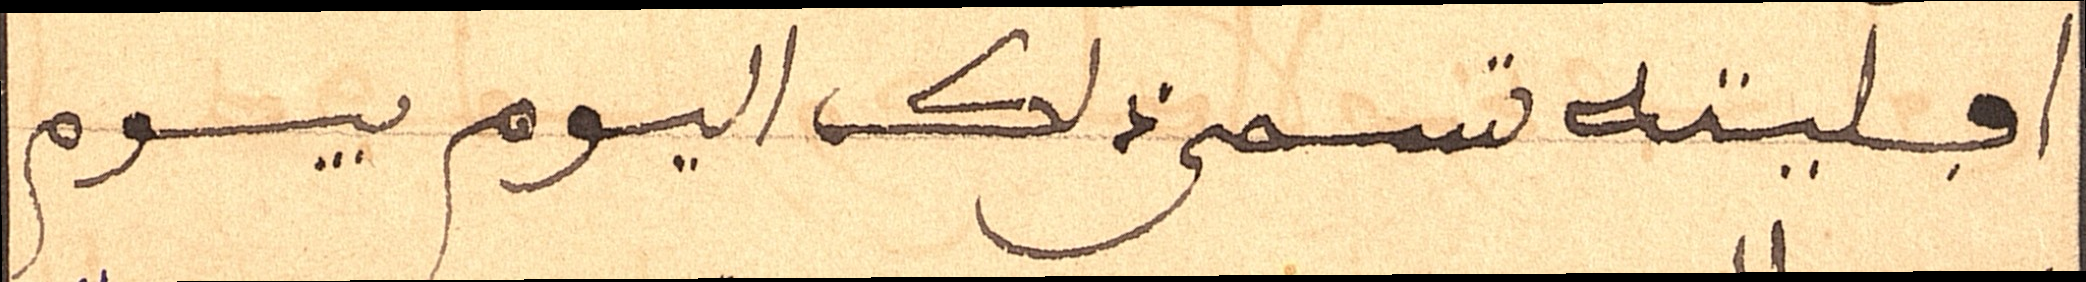افليته تسمى ذلك اليوم يوم
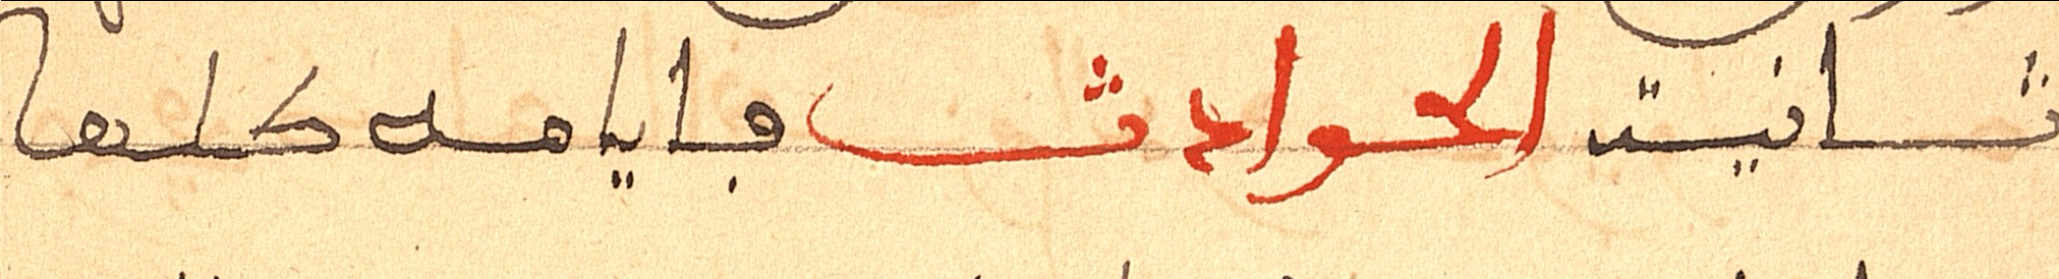ثانية الحوادث فايامه كلها
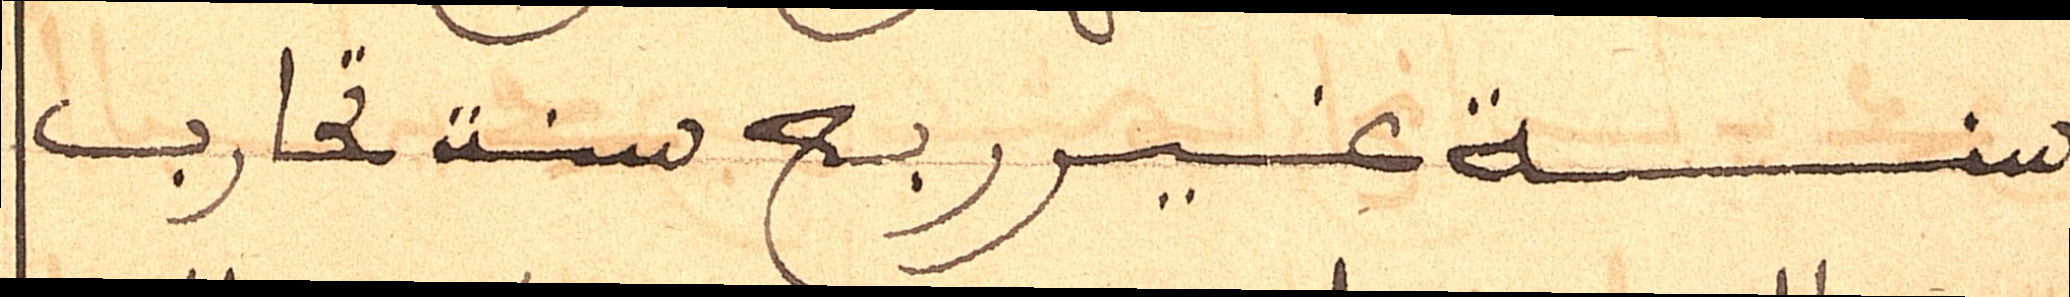سنة غير ربع سنة تحارب
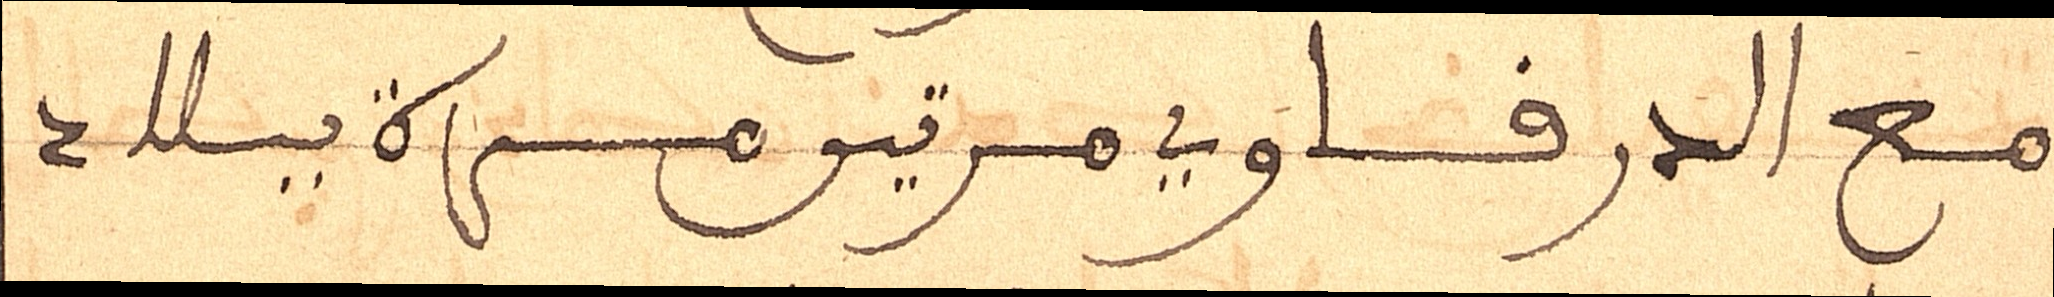مع الدرقاوي مرتين مرة ببلاد
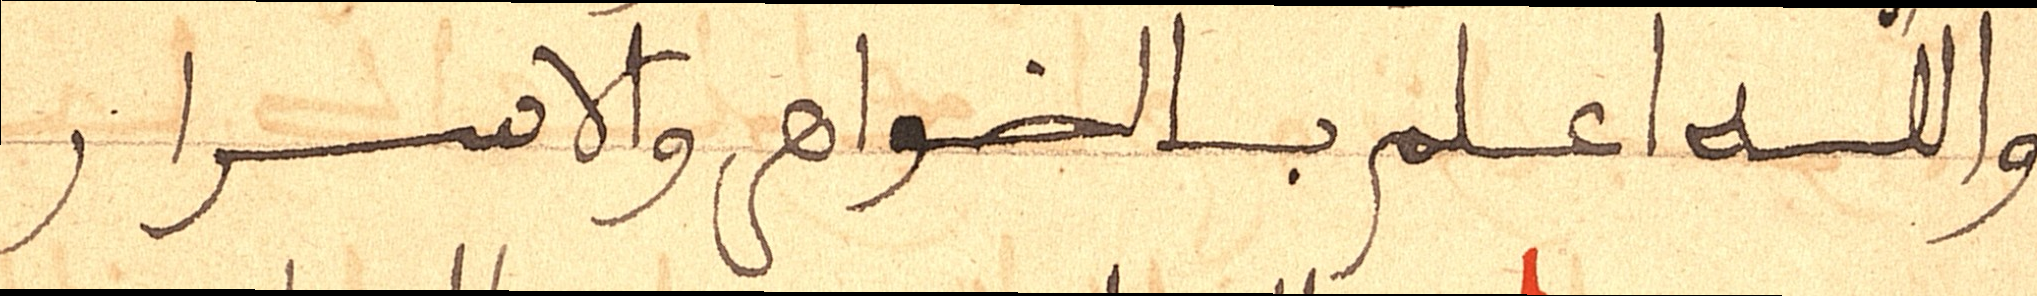والله اعلم بالضواهر والاسرار
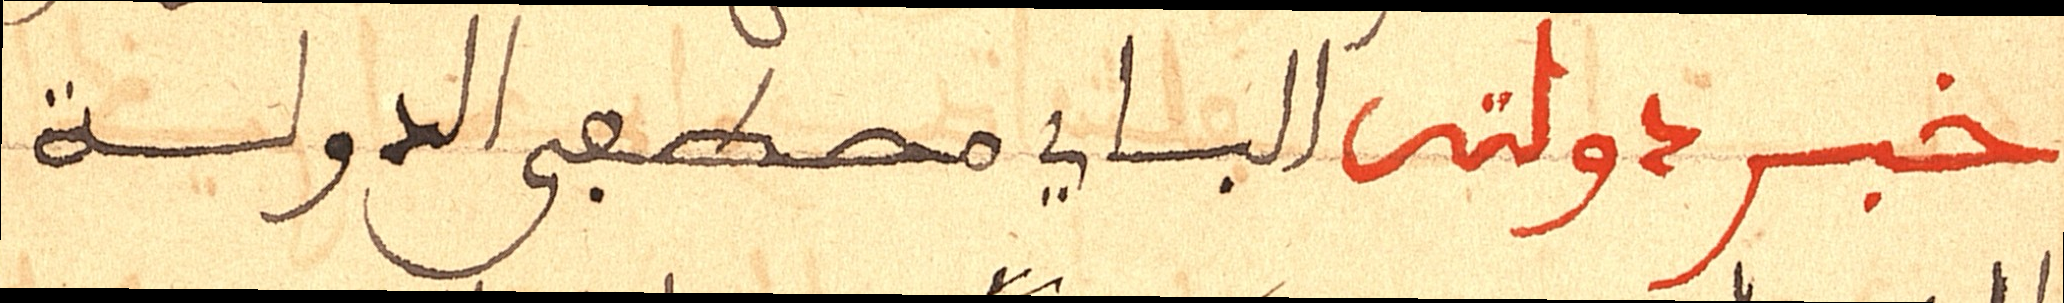خبر دولت الباي مصطفى الدولة
